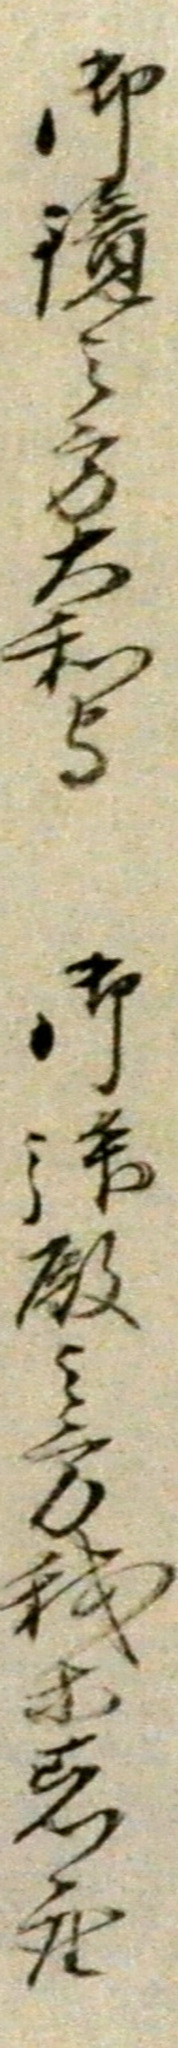御鏡之方大和守御拝殿之方我等着座
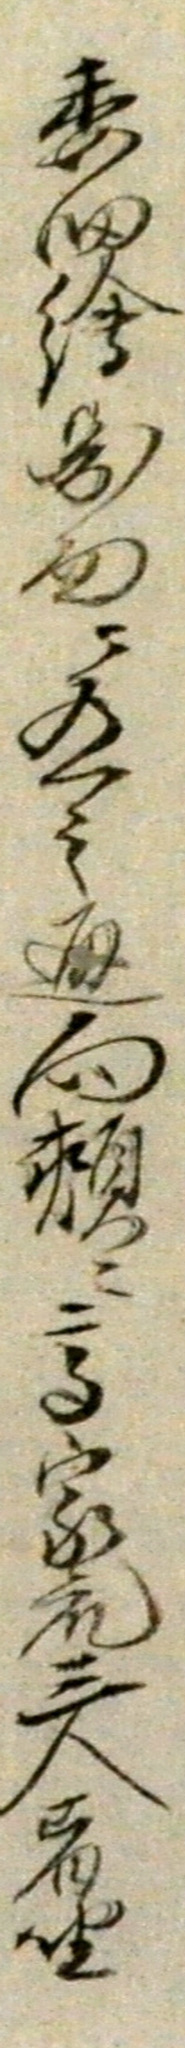委細絵図面ニ有之通向頬ニ高家衆三人着坐
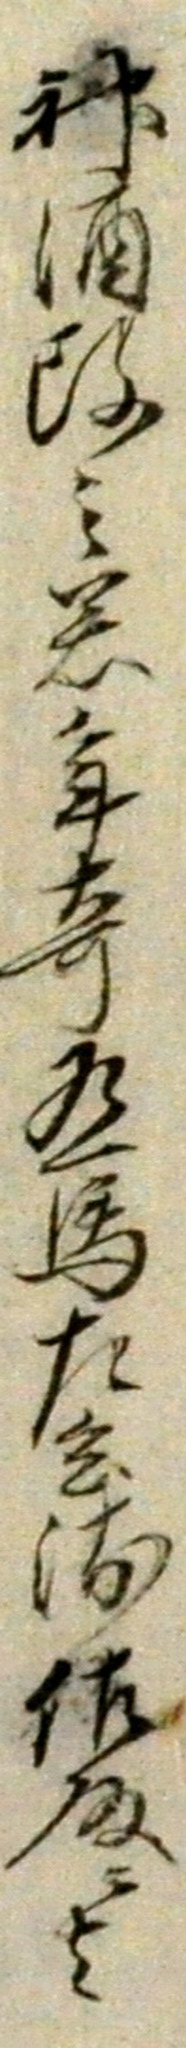神酒改之若年寄有馬左兵衛佐殿ニは
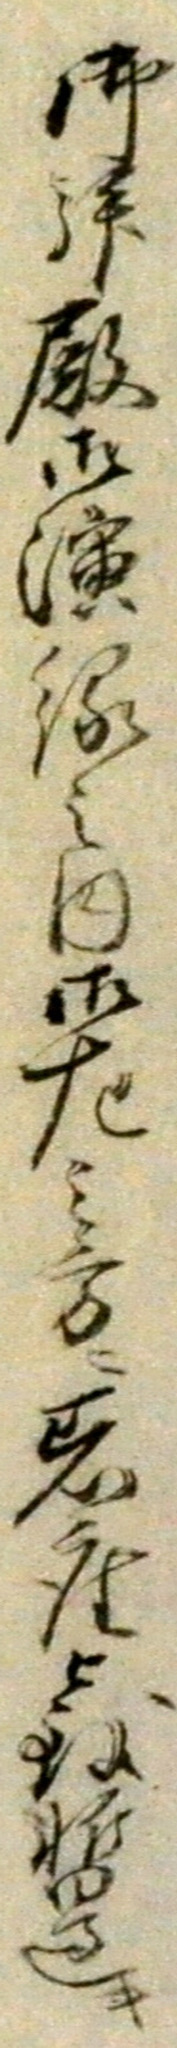御拝殿御演縁之内御左之方ニ着座被致暫過キ
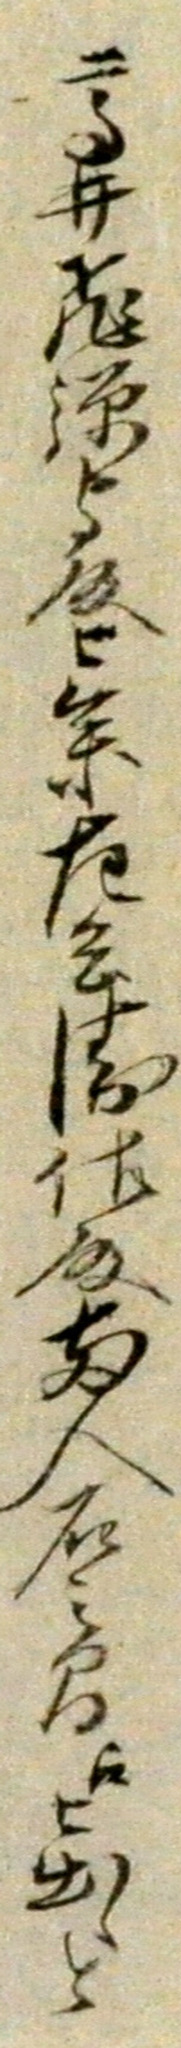高井飛騨守殿被参左兵衛佐殿両人石之間え被出候ハヽ
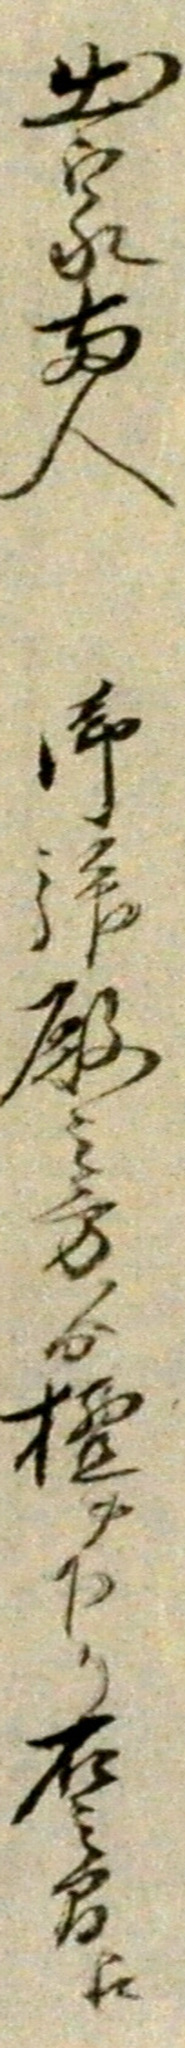出家両人御拝殿之方ゟ壇ヲ下り石之間え
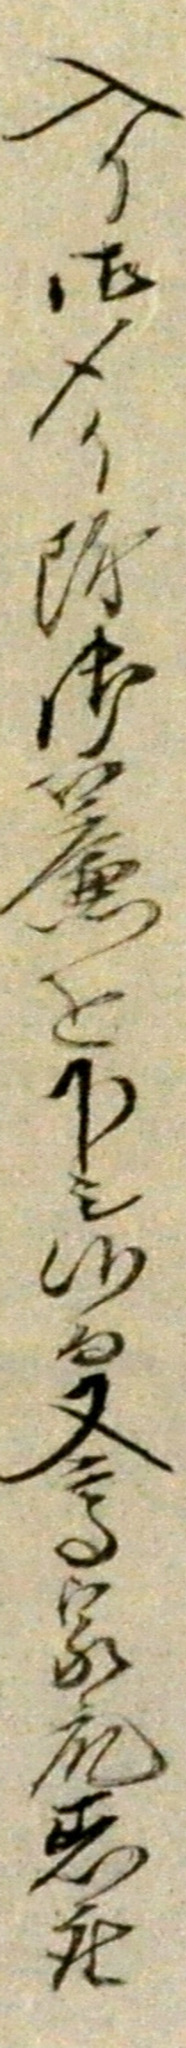入り御〆り附御簾を下シ候而又高家衆着座
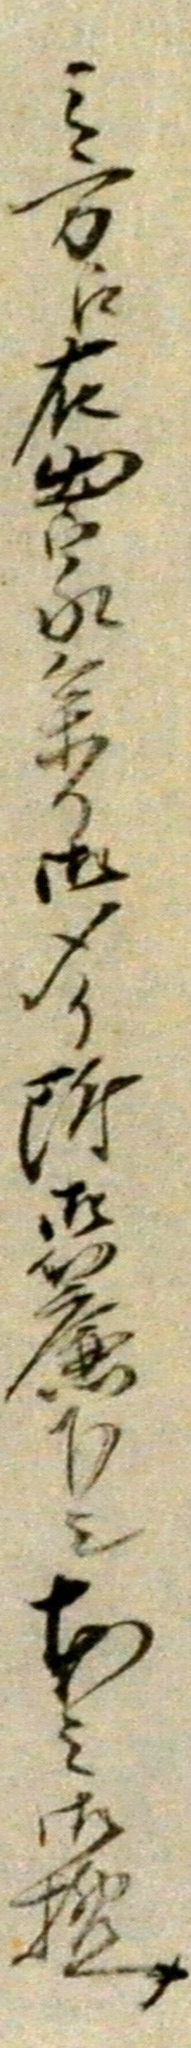之方え右出家参り御〆り附御簾下シ本之御壇ヲ
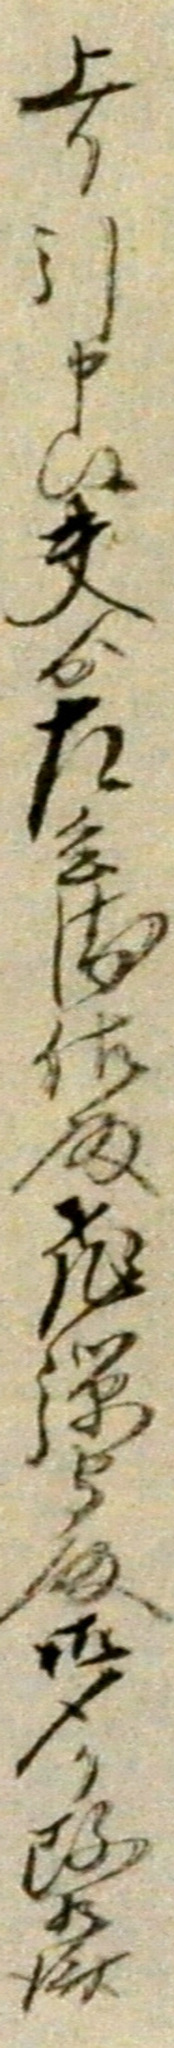上り引申候夫ゟ左兵衛佐殿飛騨守殿御〆り改相済
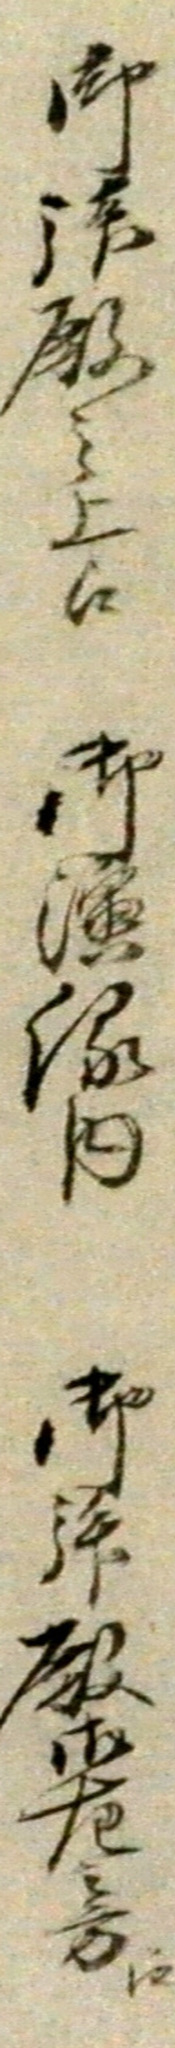御拝殿之上え御演縁内御拝殿御左之方え
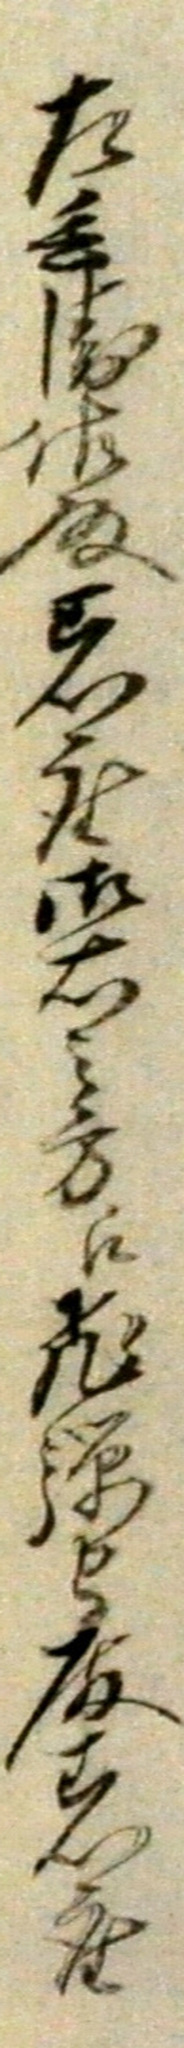左兵衛佐殿着座御右之方え飛騨守殿着座
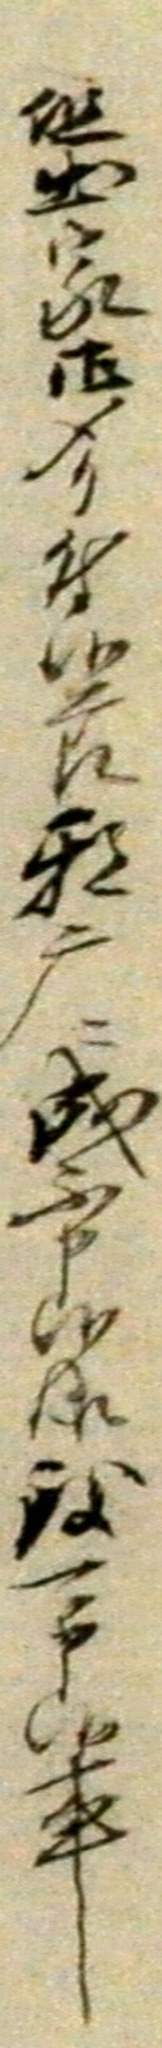但出家御〆り付候節邪魔ニ成不申候様致可申候事
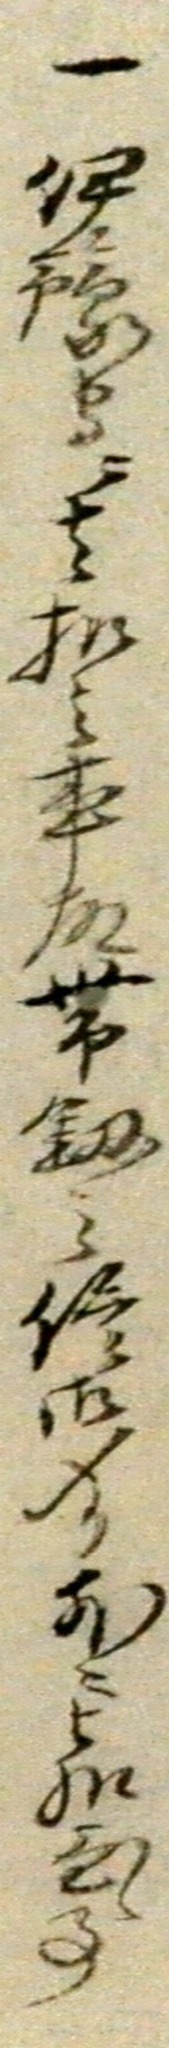一伊豫守ニは扣之事故帯剱之侭御〆り外ニ被扣置候事
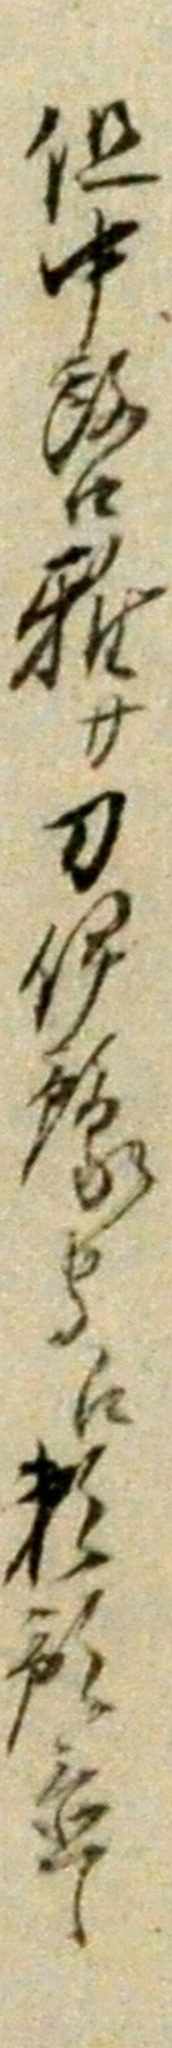但中啓稚サ刀伊豫守え頼願置候
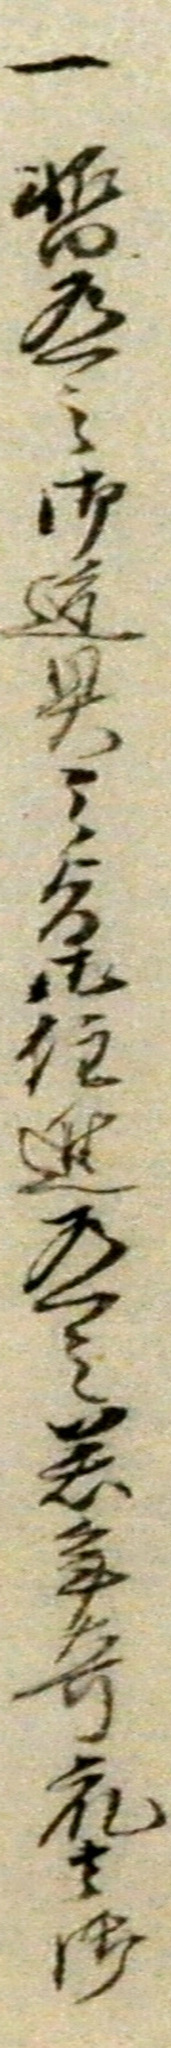一暫有之御道具之旨御注進有之若年寄衆は御
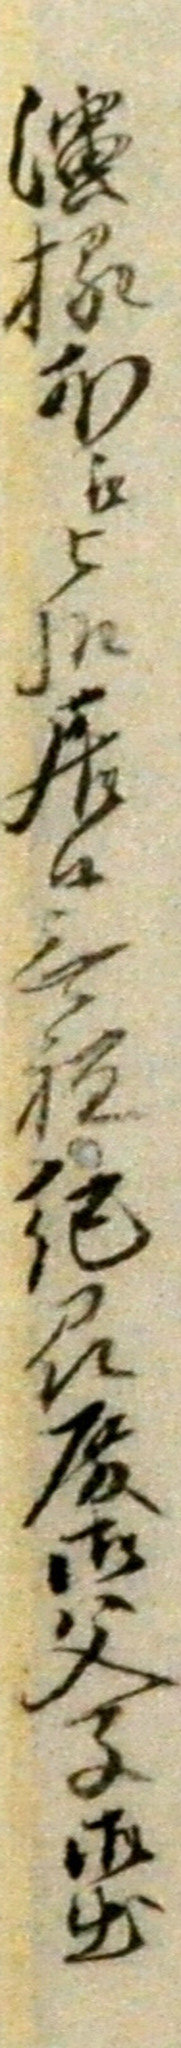演縁外え被扣居候無程紀州殿御父子御出
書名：御鏡餅御用留（写）
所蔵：伊那市立高遠町図書館・合同会社AMANE
